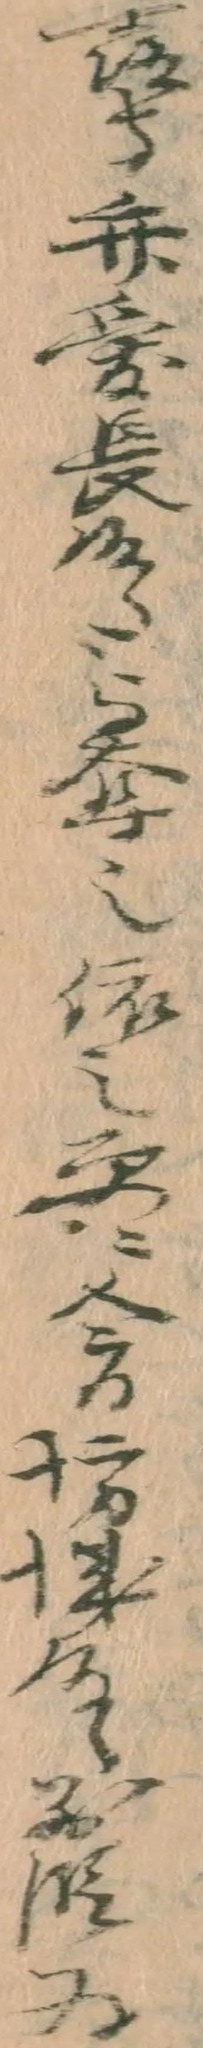露寺弁愛長殿へ与奪也依之更に今日坊城殿ヘ別段為
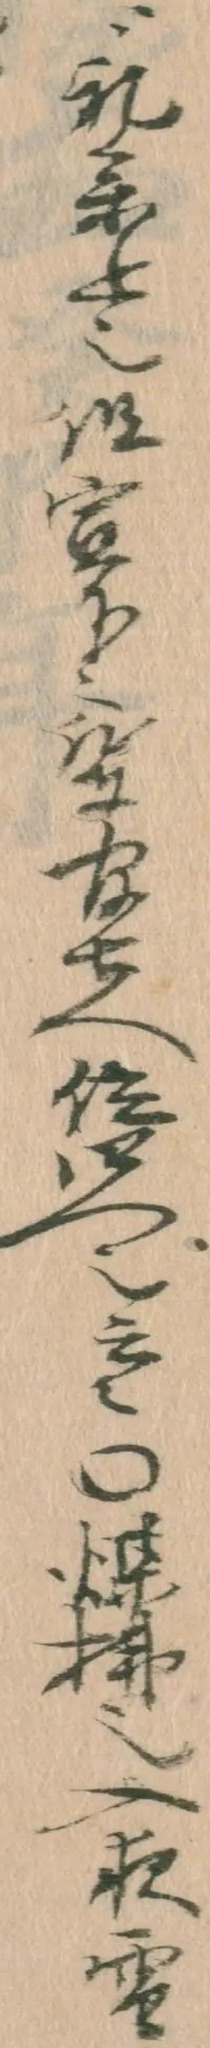御礼参上也但官下之輩官七人位四人也云々○煤払也入夜雪
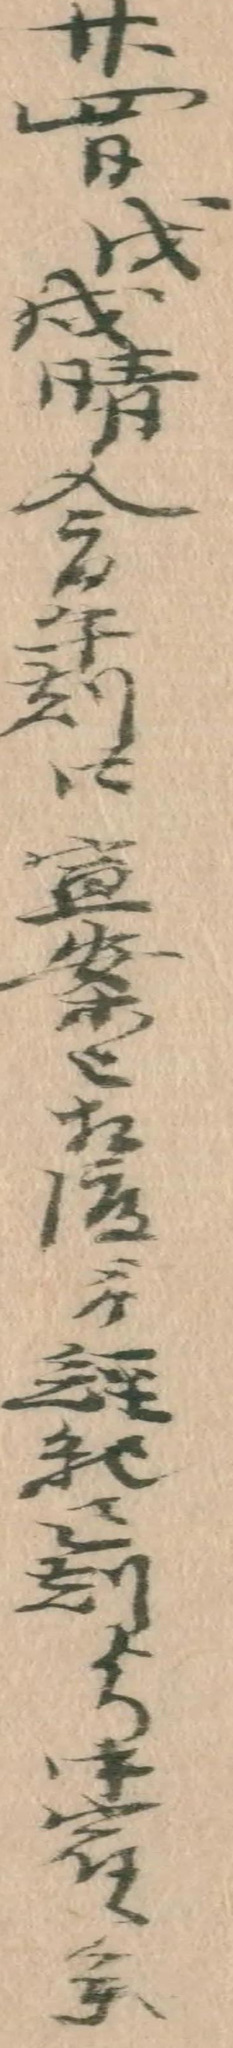廿四日戊戌晴入夜午刻に宣案被相渡ニ付経紀巳刻より中宿へ参
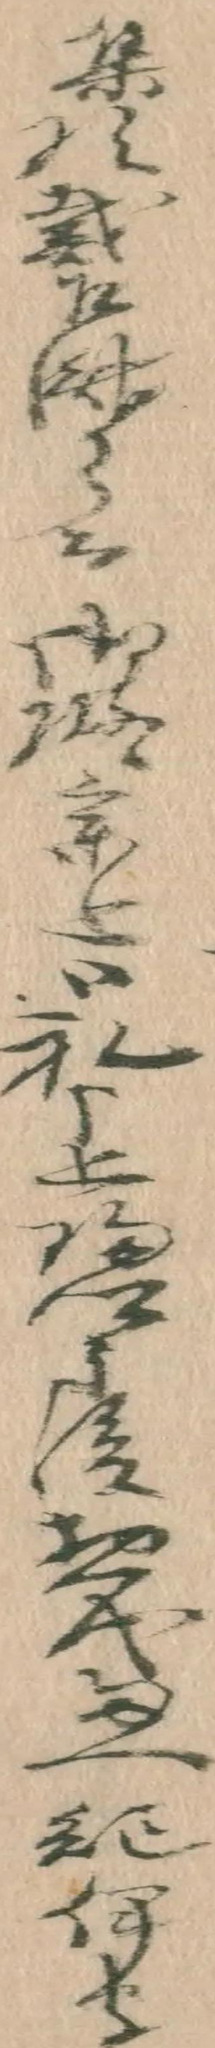集頂戴相済了而御殿参上御礼申上帰郷之後惣代両一紀伊守
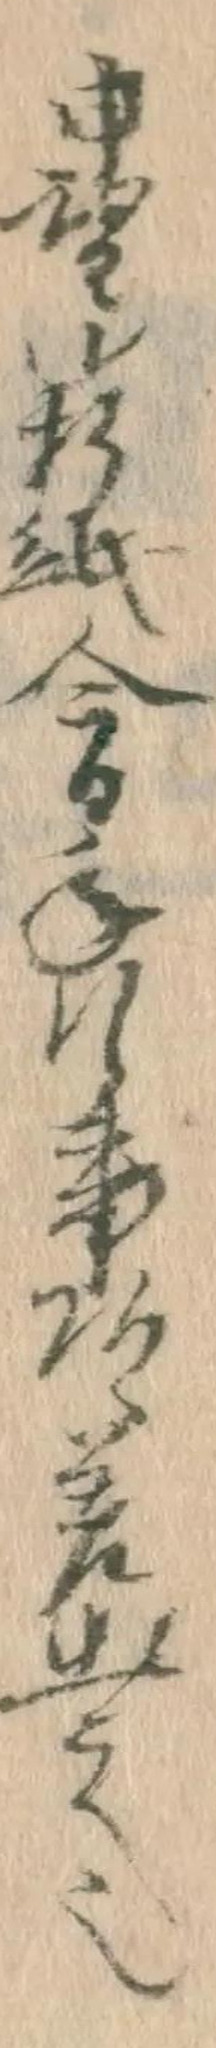申望小折紙今日年行事頭へ差出之也
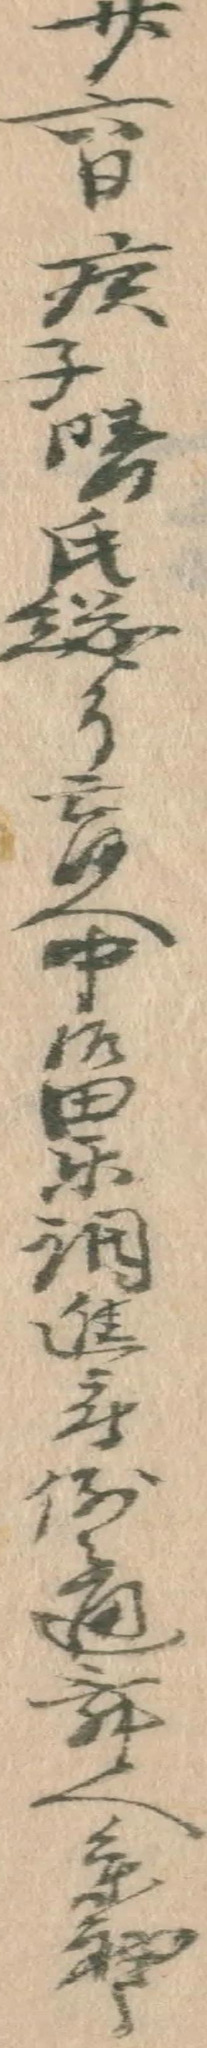廿六日庚子晴氏總より盲人中御田楽調進ニ付例之通舞人参勤申
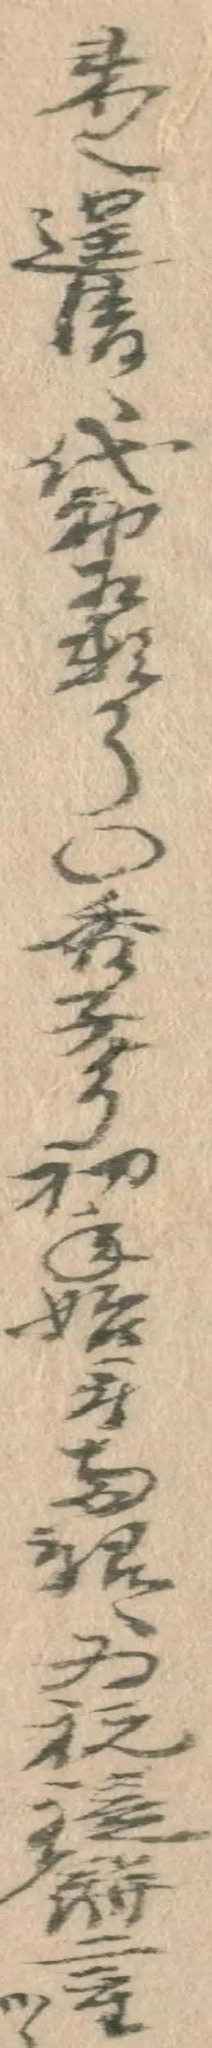来也逞清へ代勤相頼了○秀子より初年始ニ付両親へ為祝謹餅二重ツヽ送之也
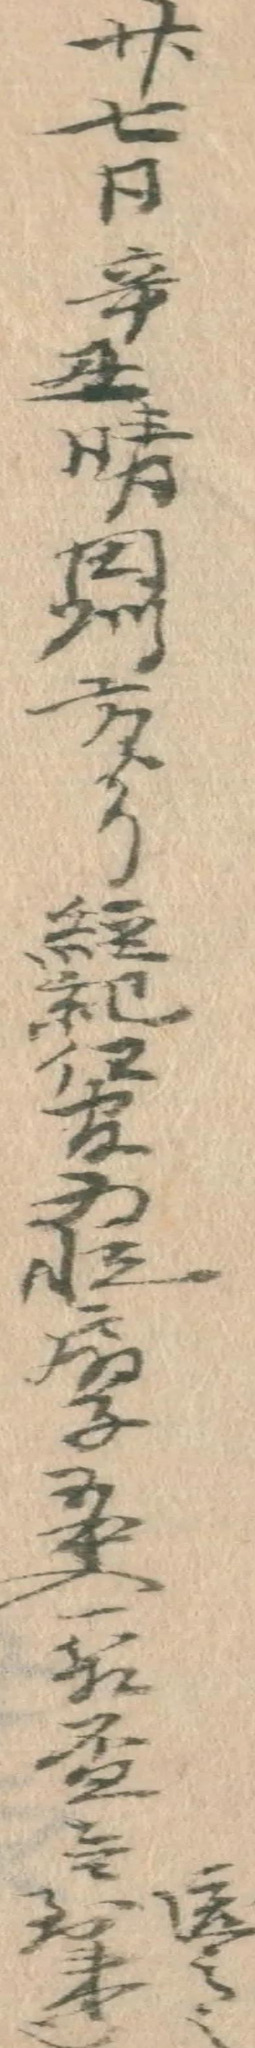廿七日辛丑晴因州方より経紀仕官為祝扇子五本入一箱盃壱到来也
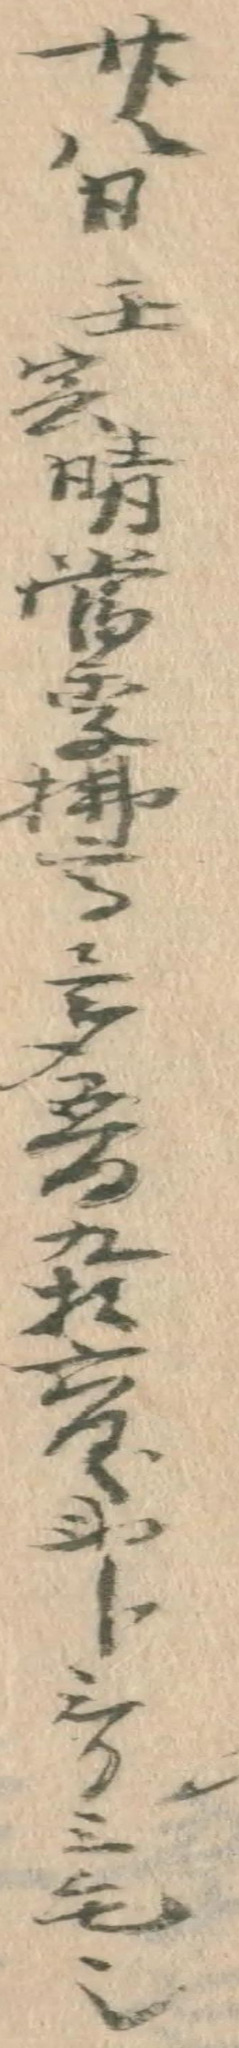廿八日壬亥晴當季払高壱〆五百九拾六匁弐分三毛也

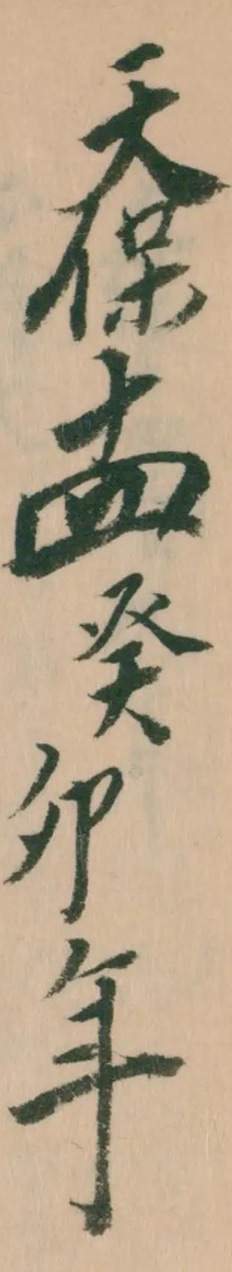天保十四癸卯年
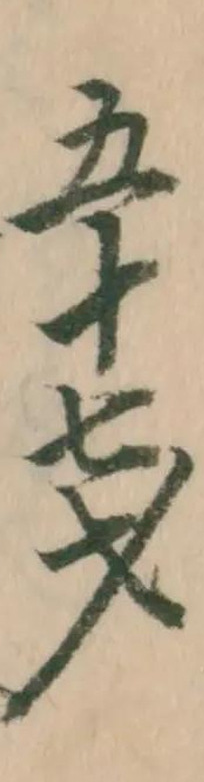五十七才

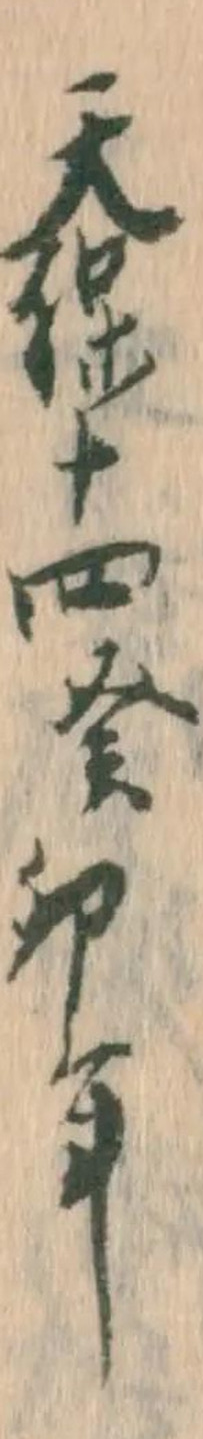天保十四癸卯年
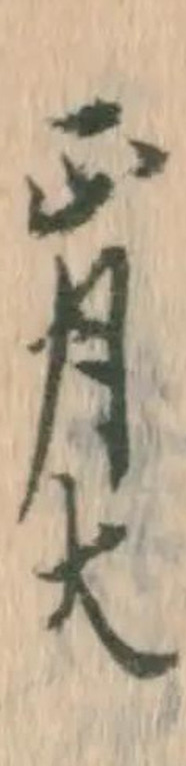正月大
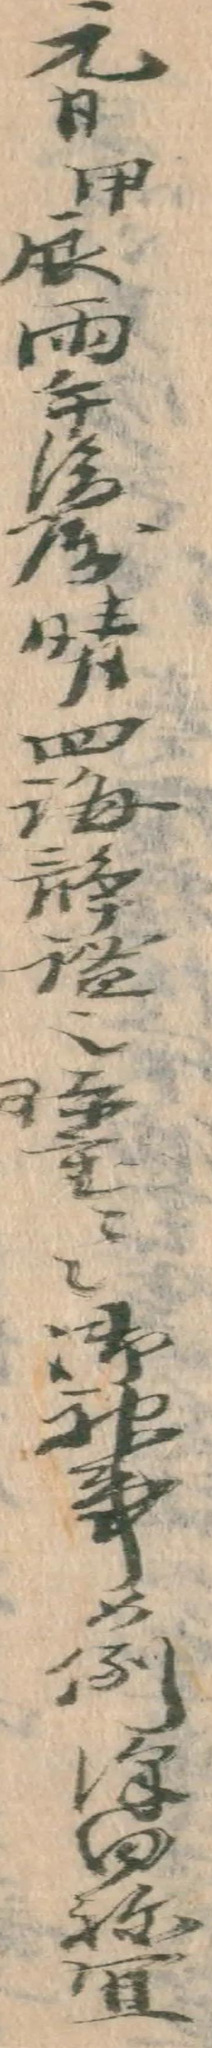一元日甲辰雨属晴四海静謐也珍重々々御神事如例澤田祢宜
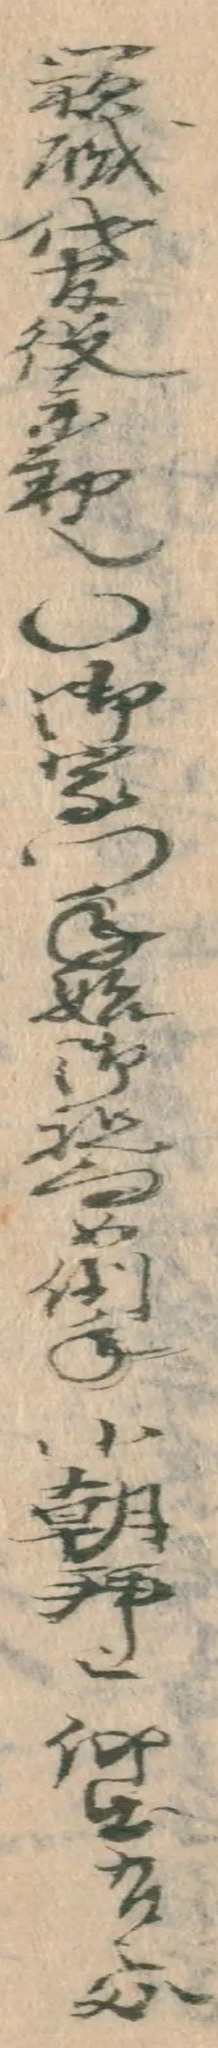闕職代官役参勤也○御家門年始御祝向如例年小朝拝被仰出有之処
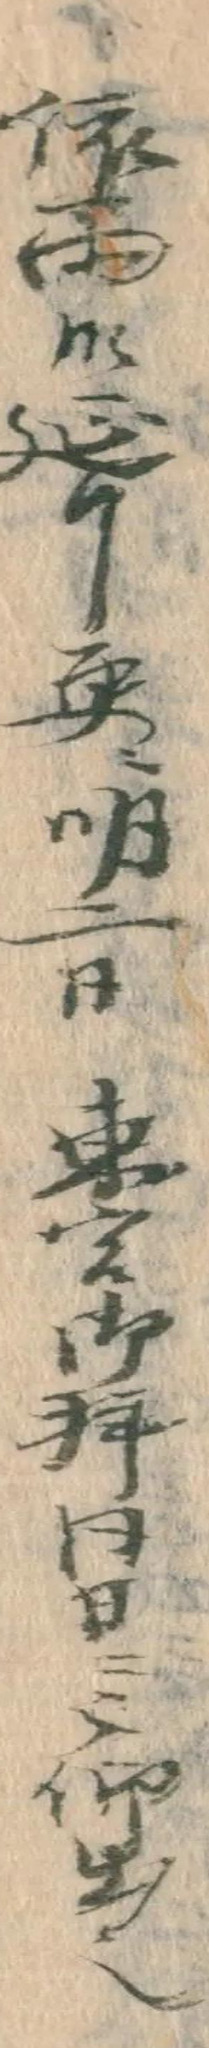依雨御延引更ニ明二日東宮御拝同日ニ被仰出也
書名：賀茂社記録. 第69冊
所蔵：国立国会図書館 National Diet Library, JAPAN
